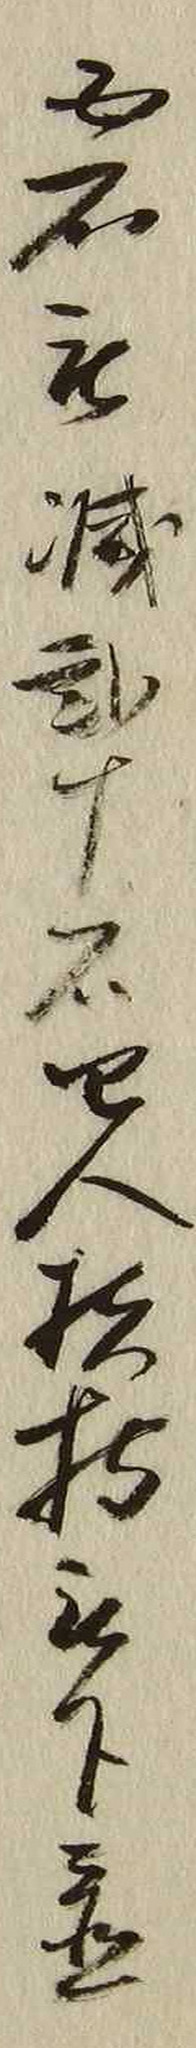五石被減弐十石四人扶持被下置
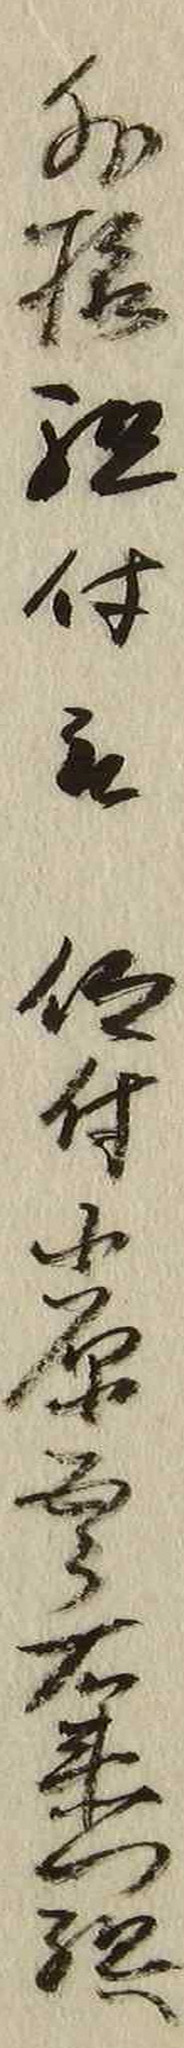外様組付被仰付小原五郎右衛門組へ
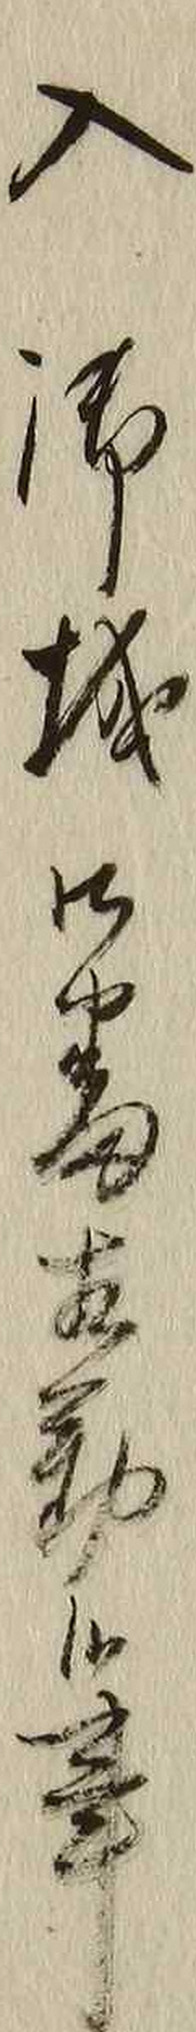入御城御番相勤候事
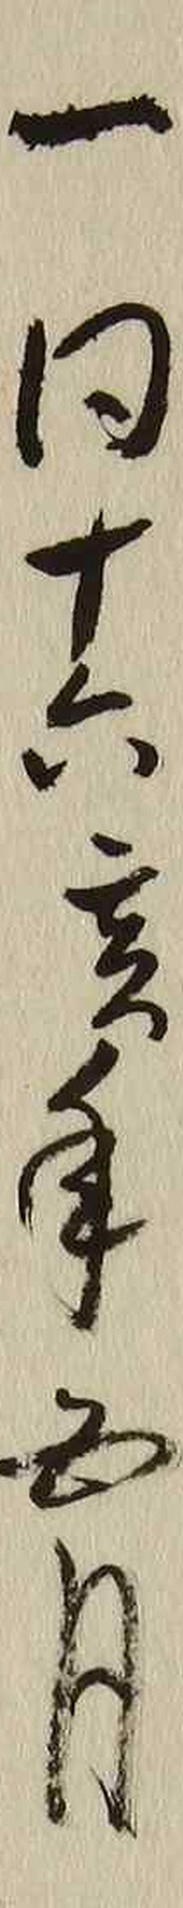一同十六亥年五月
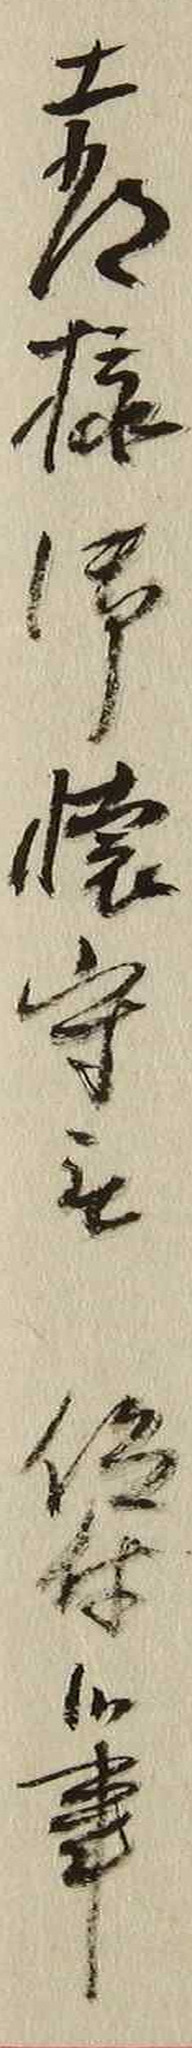土常様御懐守被仰付候事
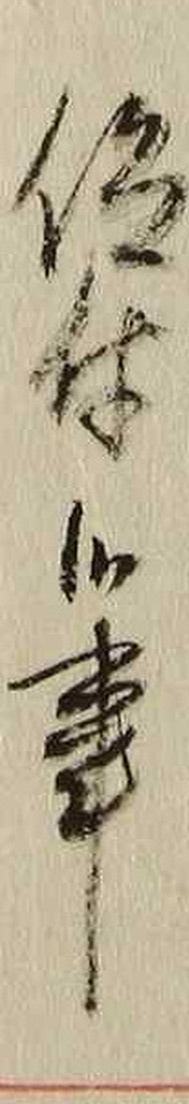仰付候事
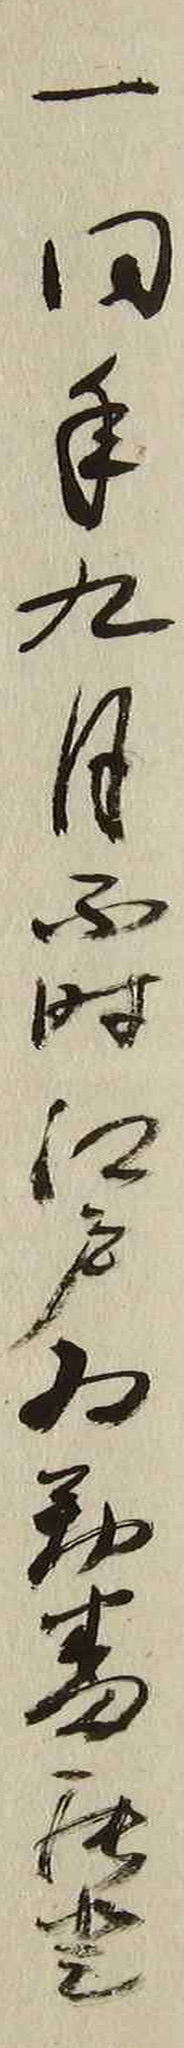一同年九月不時江戸為勤番罷登
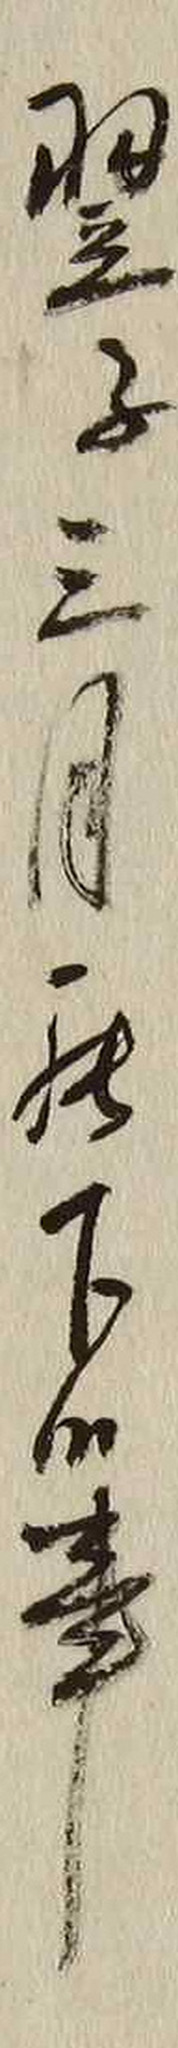翌子三月罷下候事
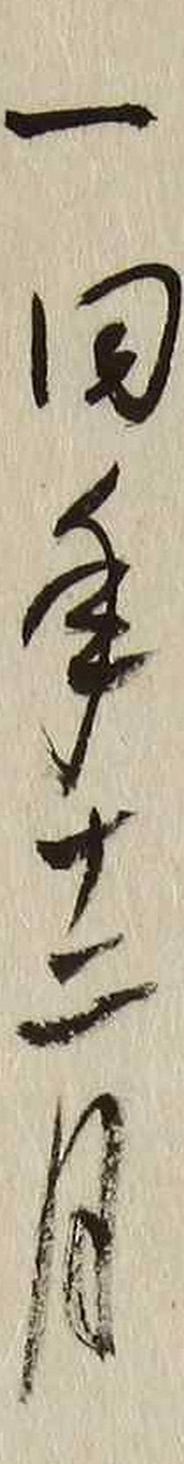一同年十二月
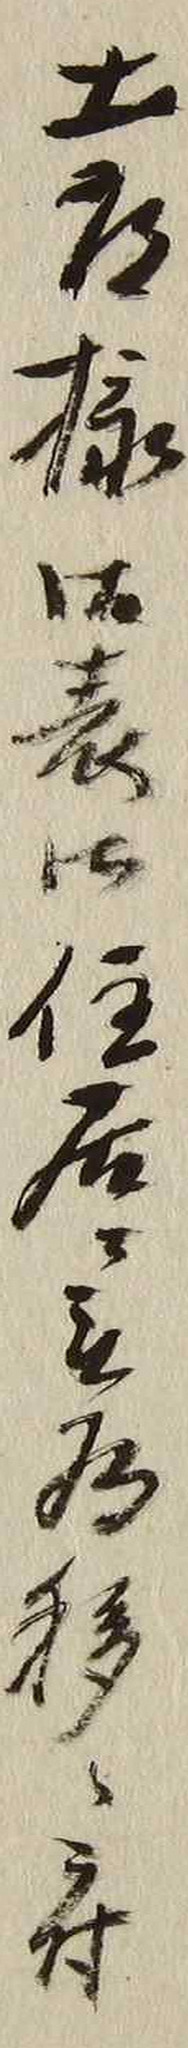土常様御表御住居ニ被為移候ニ付
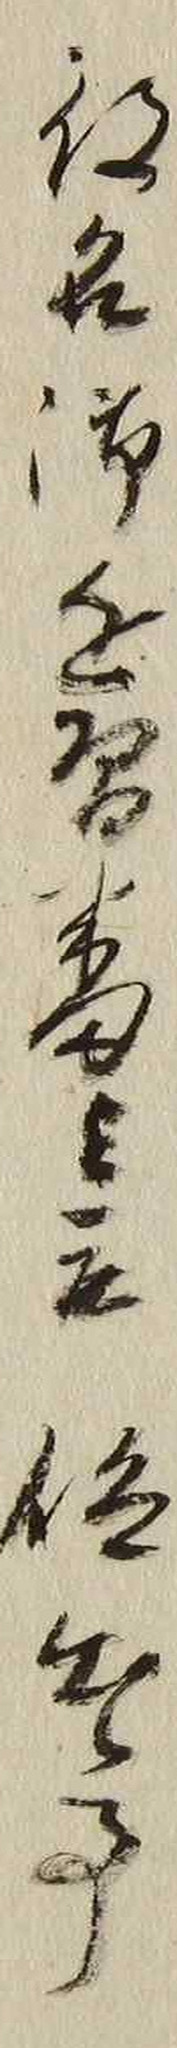役名御近習番与被仰出候事
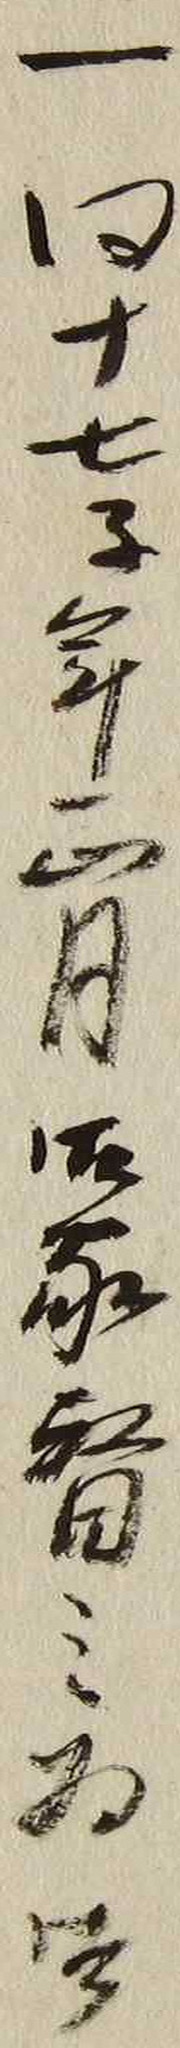一同十七子年正月御家督之為御
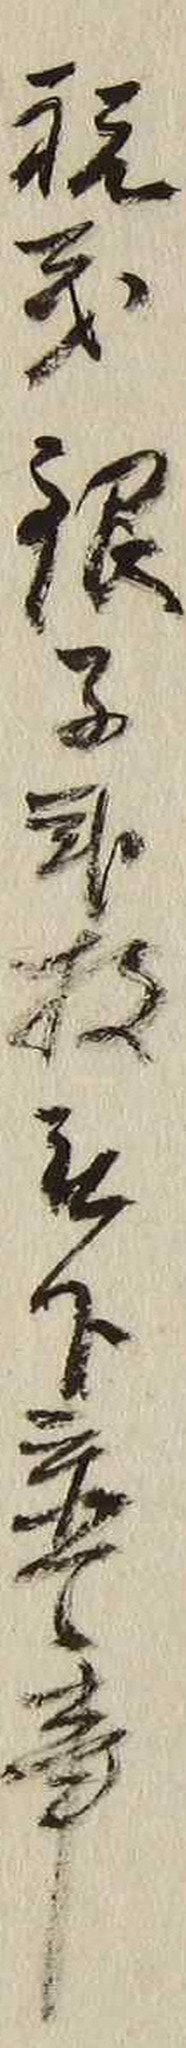祝義銀子弐枚被下置候事
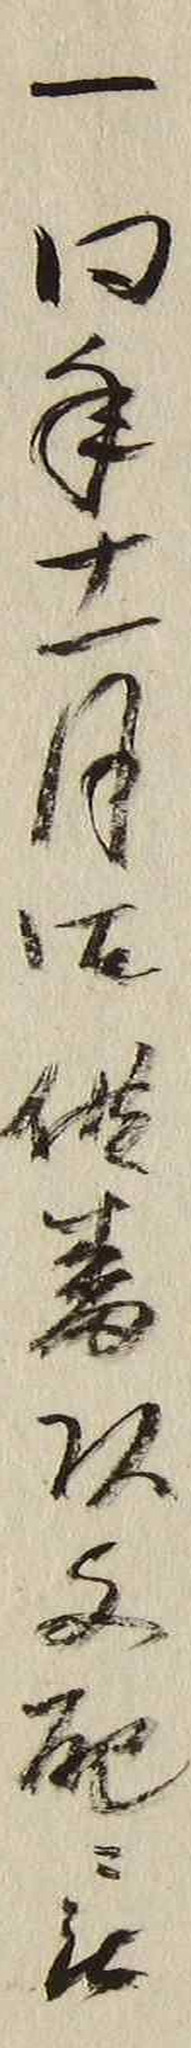一同年十一月御供番頭支配ニ被
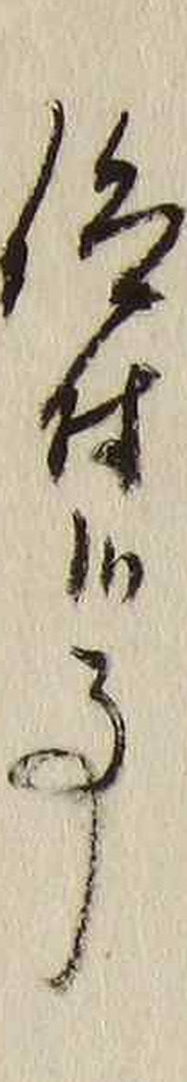仰付候事
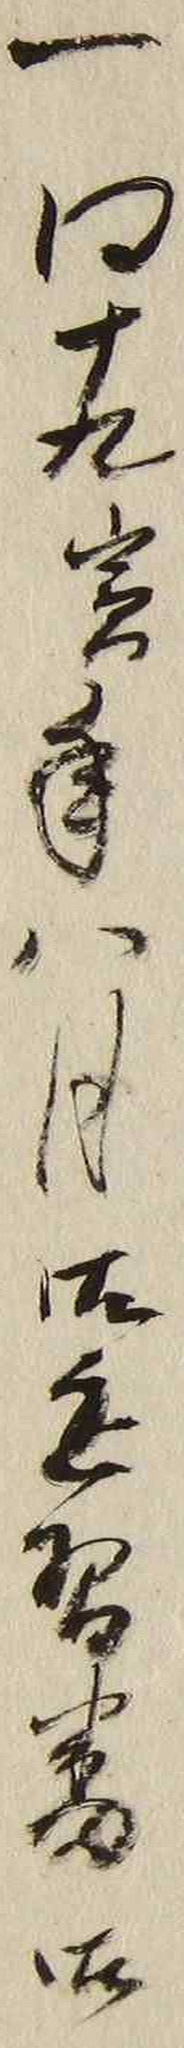一同十九寅年八月御近習番御
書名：諸士系譜　巻之346　も之部2
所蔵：会津若松市立会津図書館
